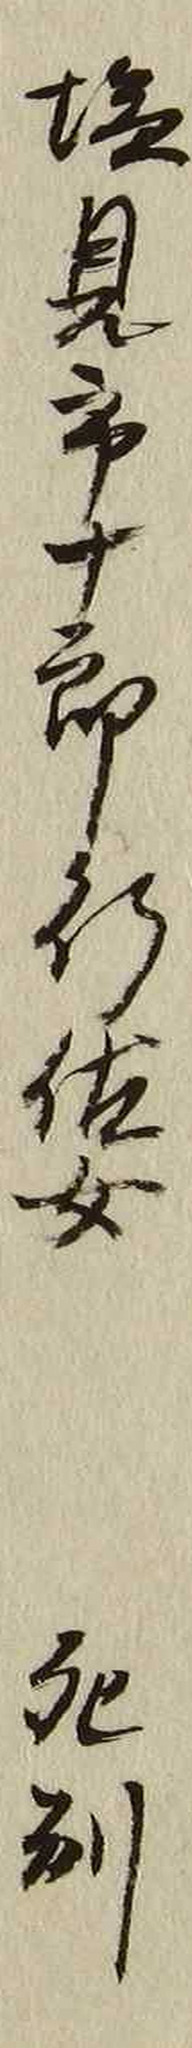塩見市十郎行佐女死別
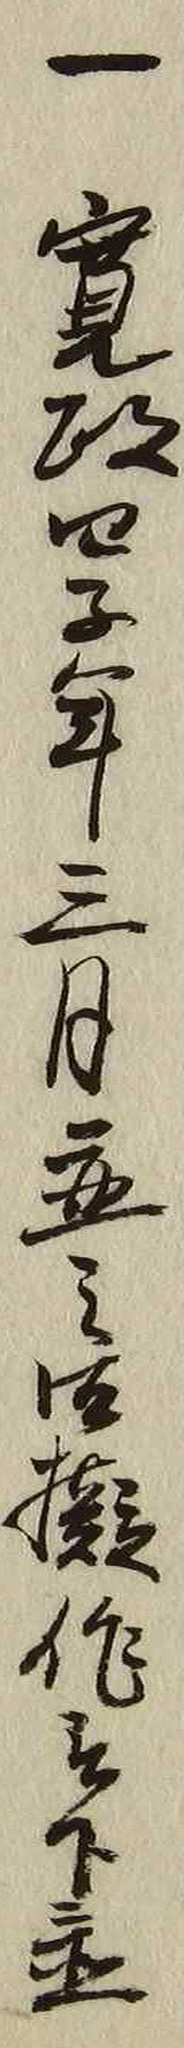一寛政四子年三月並之御擬作被下置
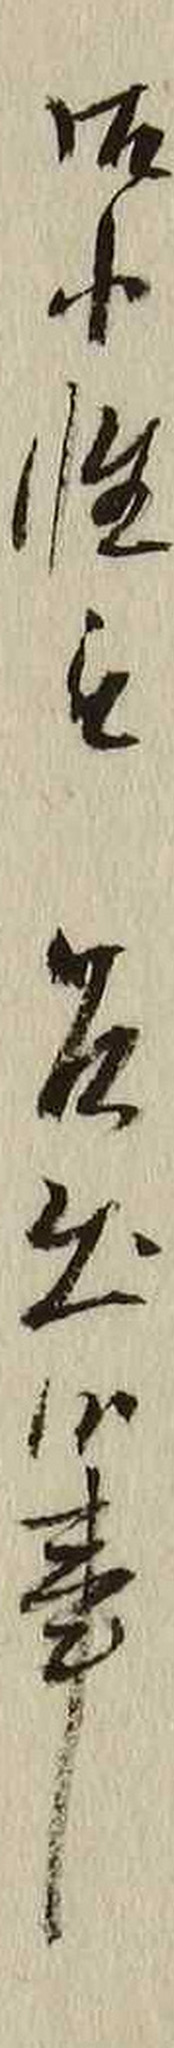御小性被召出候事
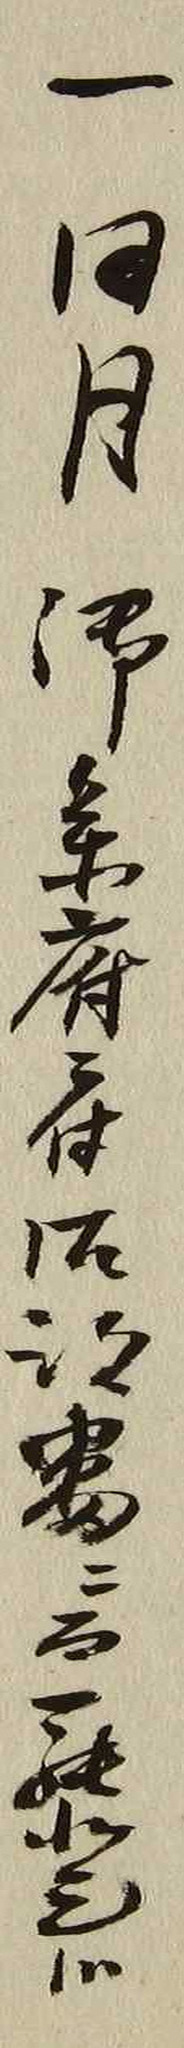一同月御参府ニ付御跡番ニ而罷登候
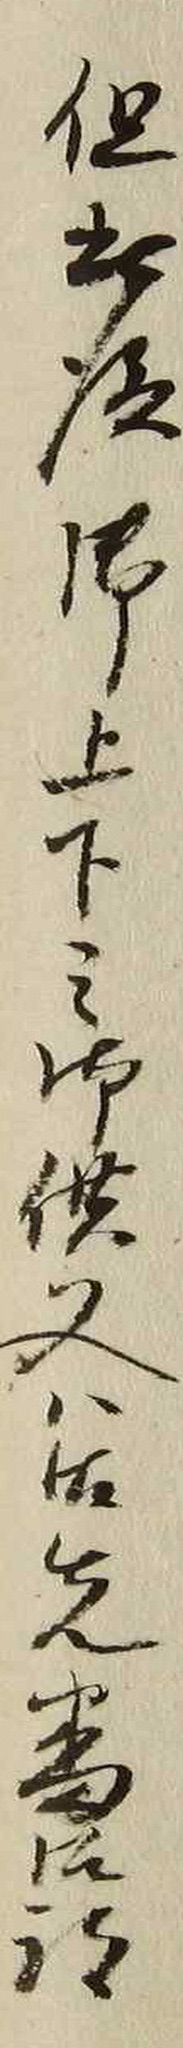但此後御上下之御供又ハ御先番御跡
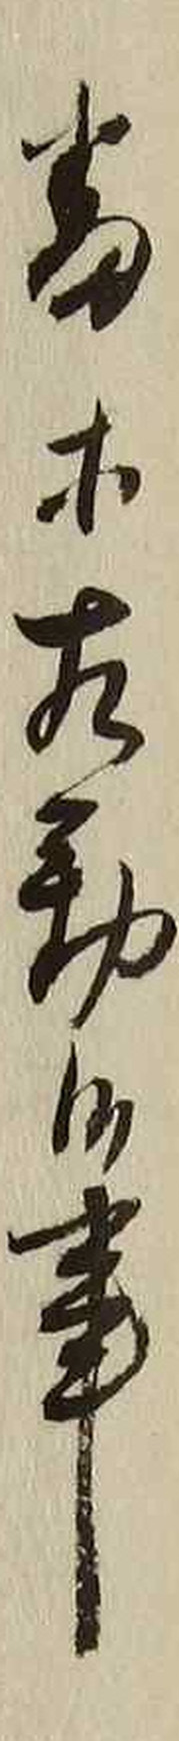番等相勤候事
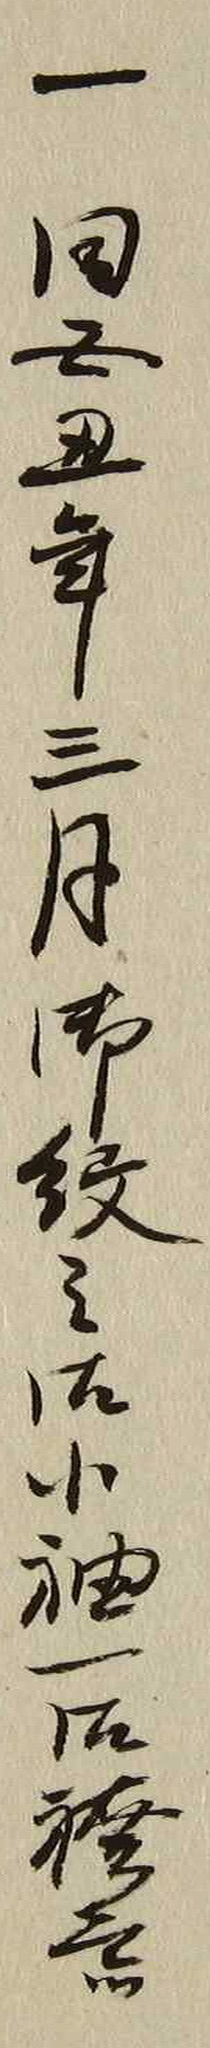一同五丑年三月御紋之御小袖一御袴壱ツ
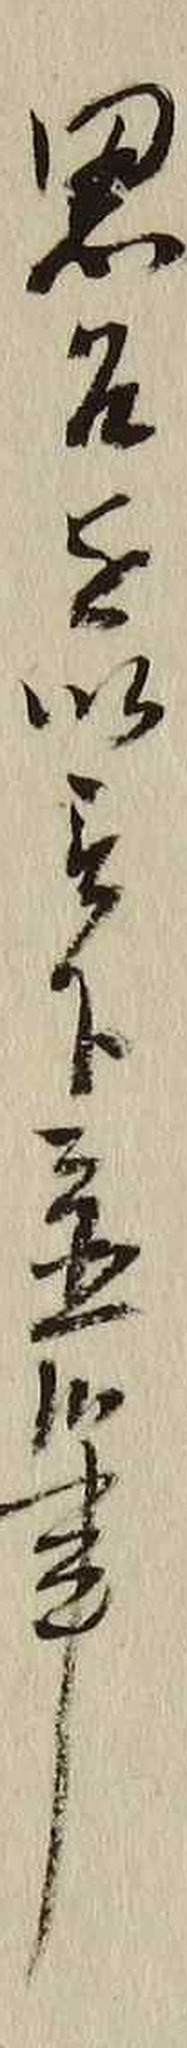思召を以被下置候事
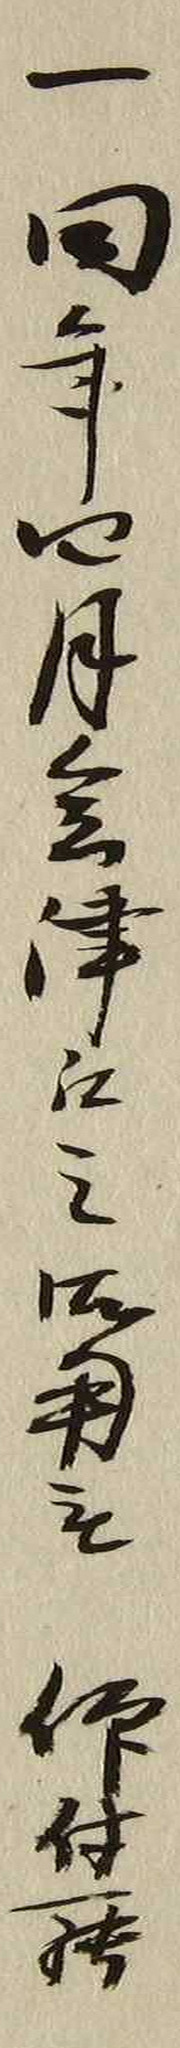一同年四月会津江之御用被仰付罷
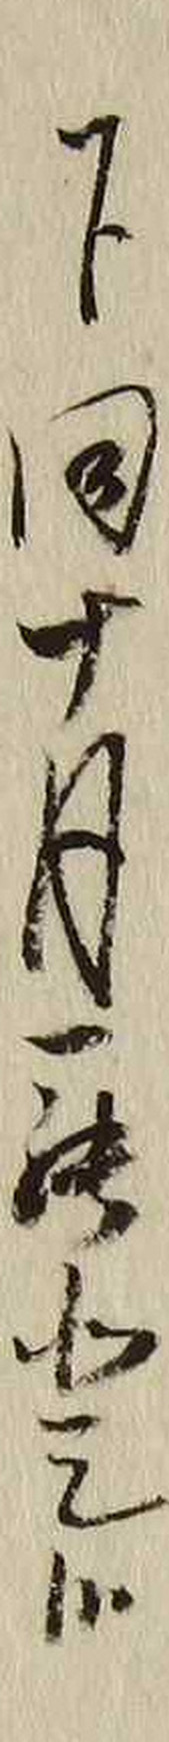下同十月罷登候
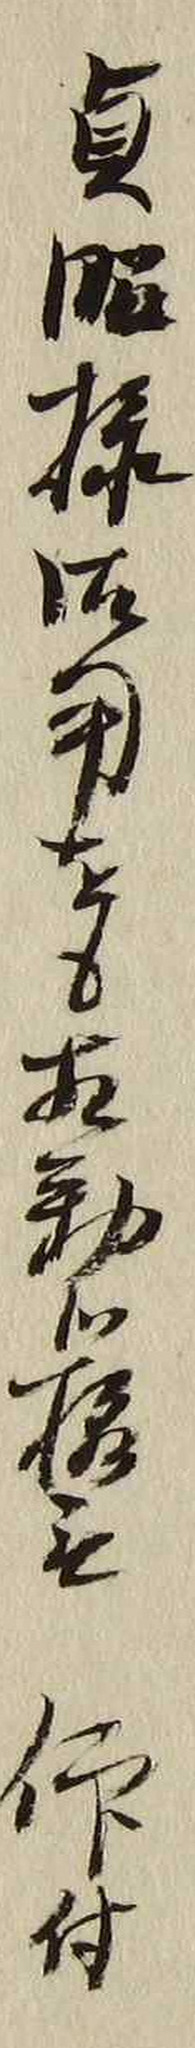貞昭様御用をも相勤御候様被仰付
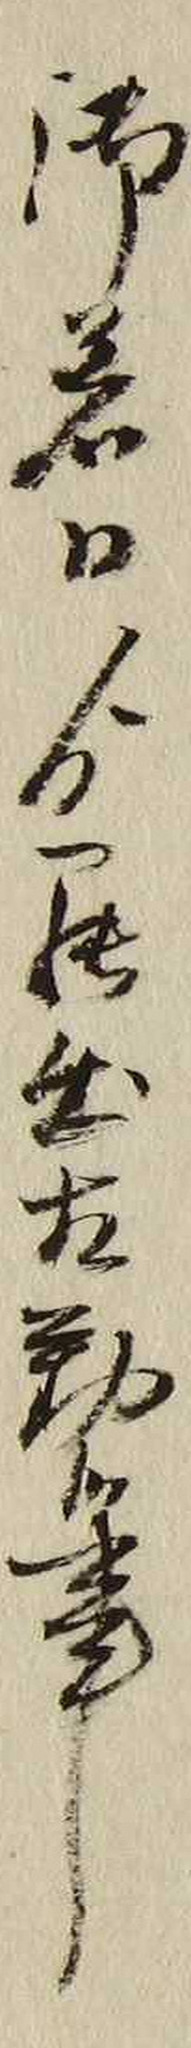御着日ゟ罷出相勤候事
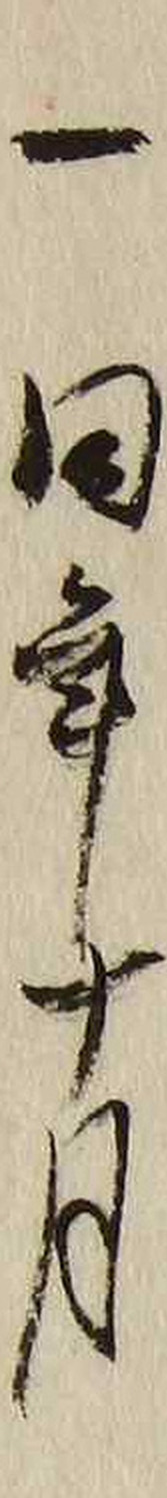一同年十月
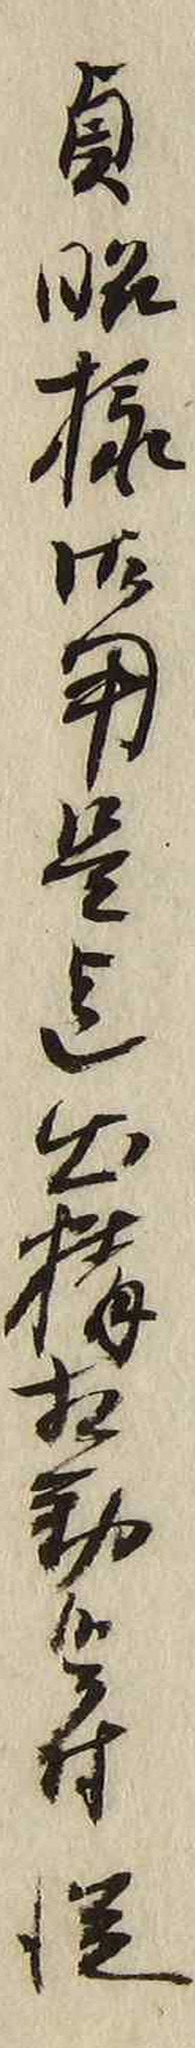貞昭様御用是迄出精相勤候ニ付従

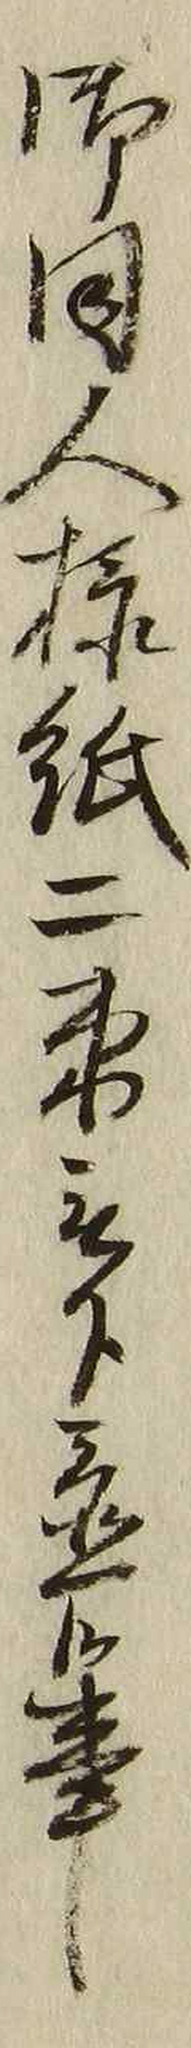御同人様紙二束被下置候事
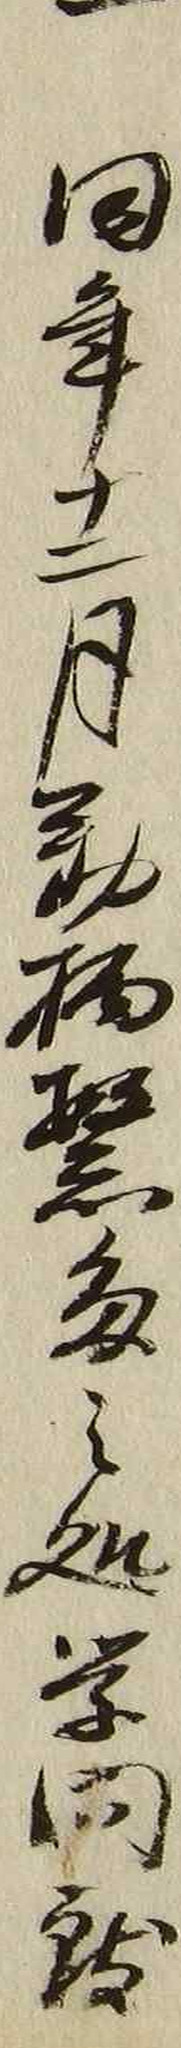一同年十二月勤柄繁多之処学問致
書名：諸士系譜　巻之345　も之部1
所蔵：会津若松市立会津図書館
